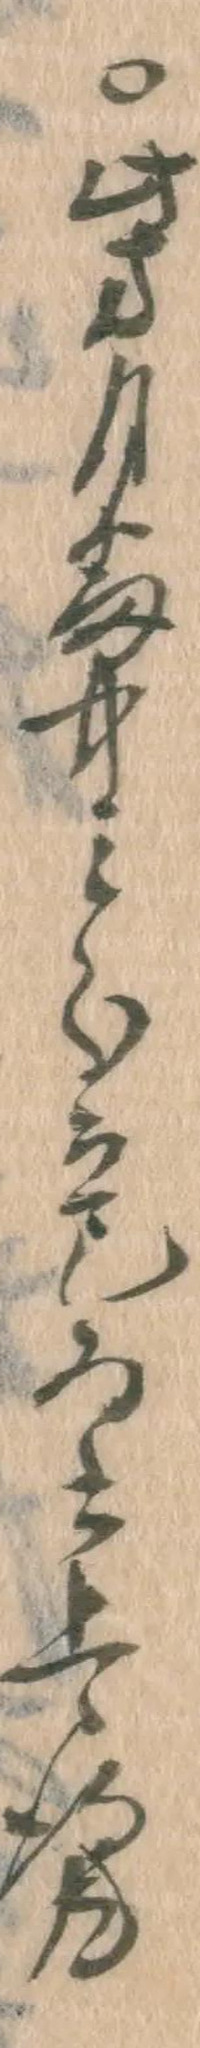◯此方月番中之分而已為書上候得共
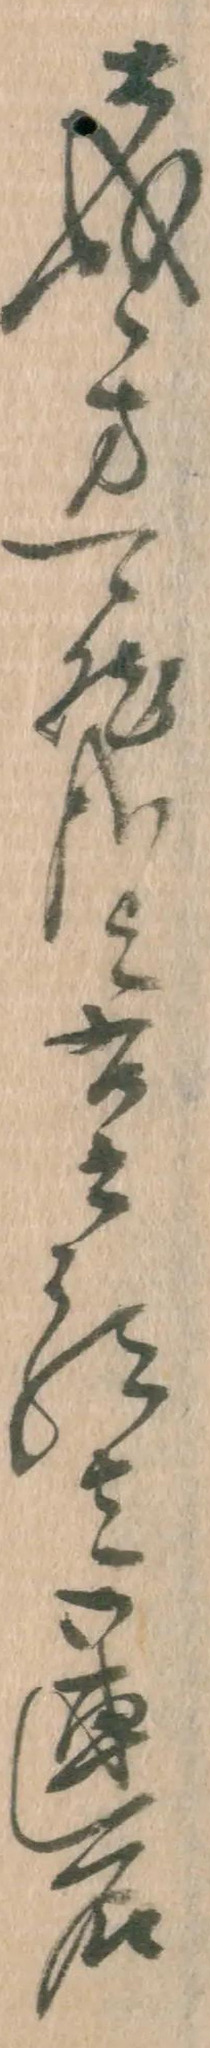相成候方可然哉と右書類は御連名
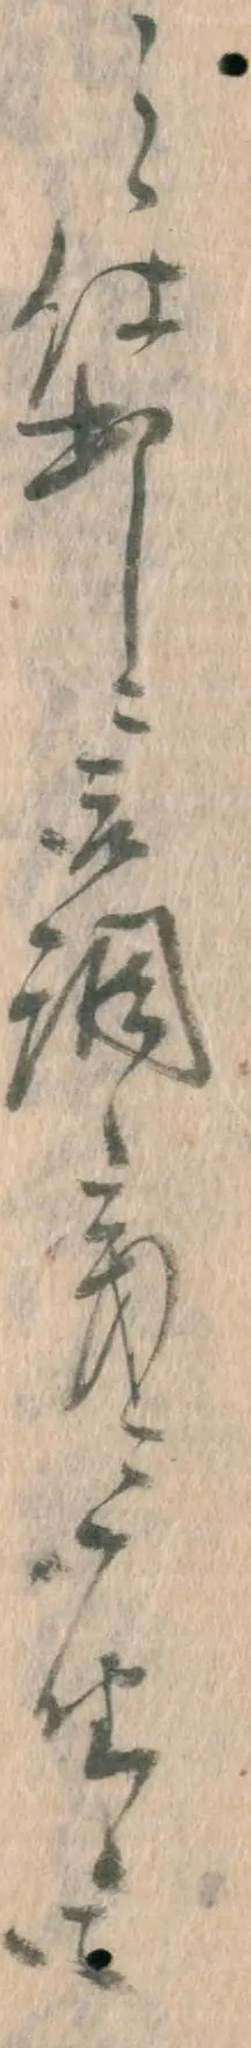之仕出しニ取調候義ニ御座候以上

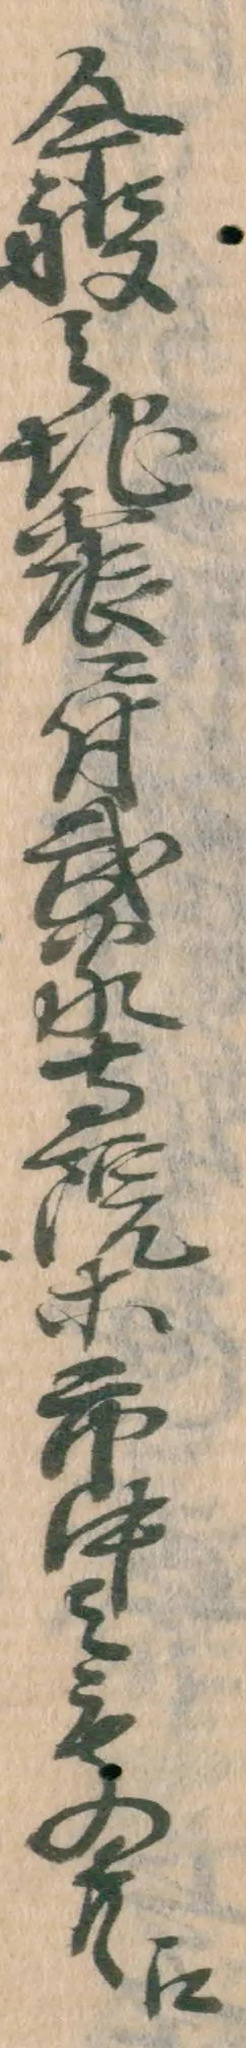今般之地震ニ付武家寺院等市中之もの共え
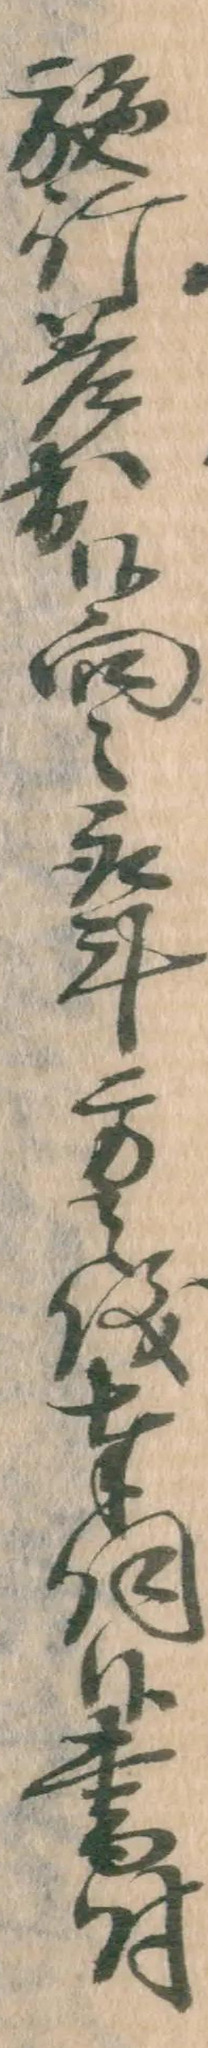施行差出候向之取計方之儀奉伺候書付
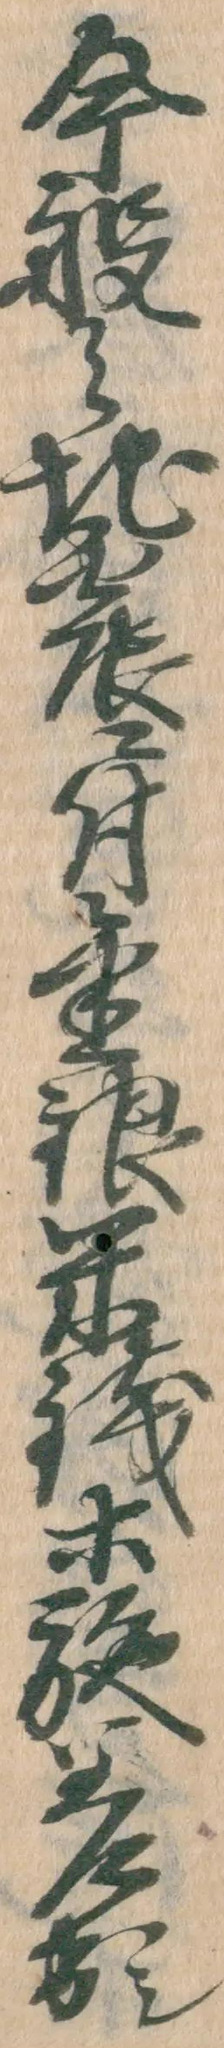今般之地震ニ付金銀米銭等施差出シ
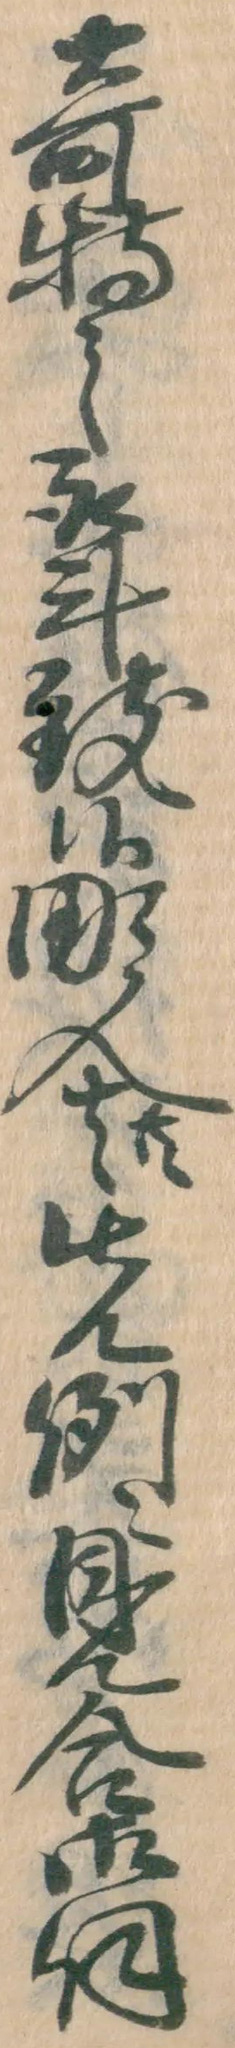奇特之取計致候町人共は先例ニ見合御伺

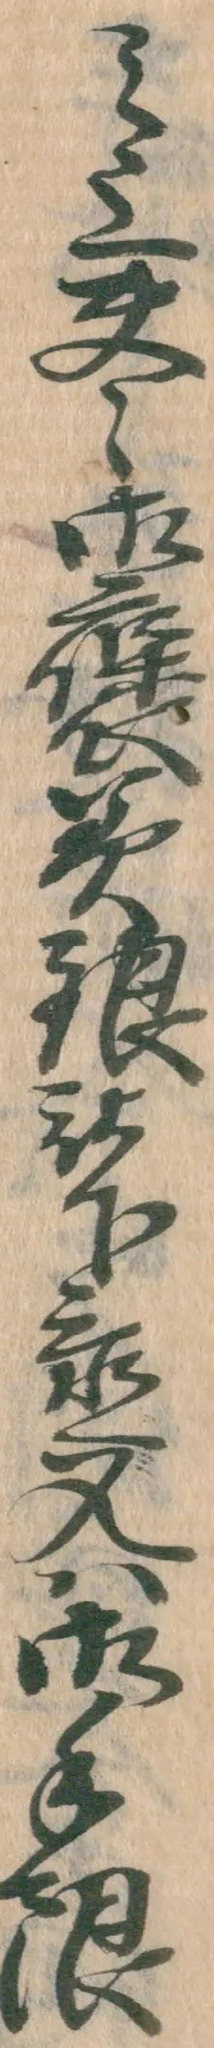之上夫々御褒美銀被下置又ハ御手限
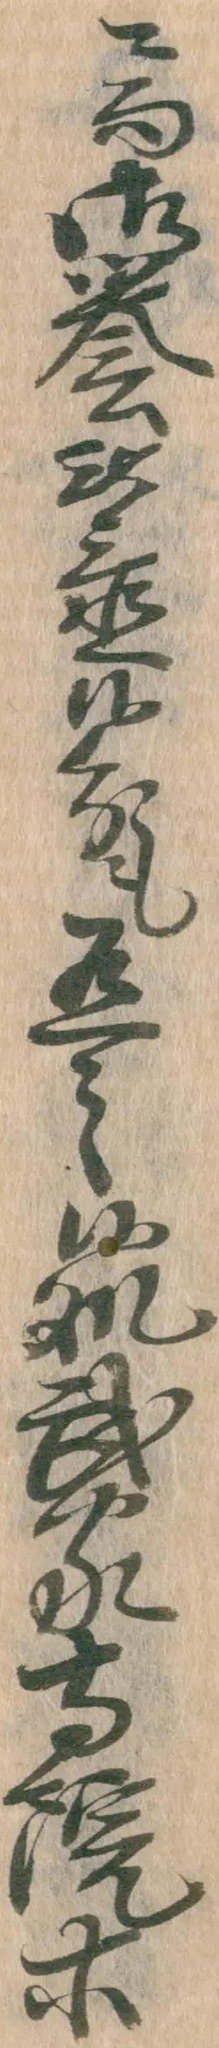ニ而御誉被置候分も有之候処武家寺院等
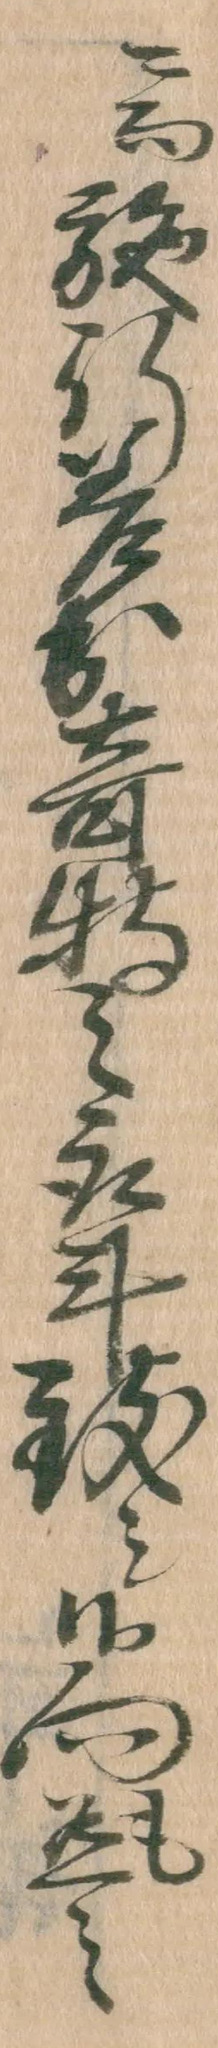ニ而施行差出奇特之取計致シ候向も有之
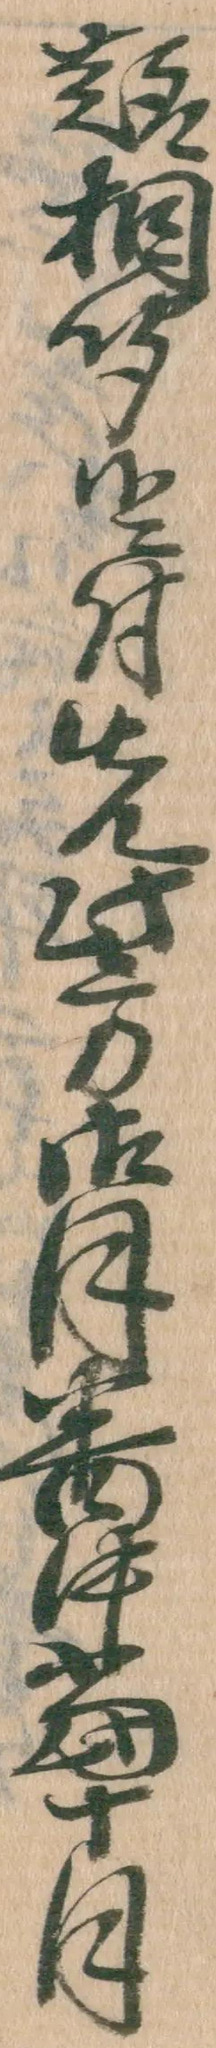趣相聞候ニ付先此方御月番中当十月
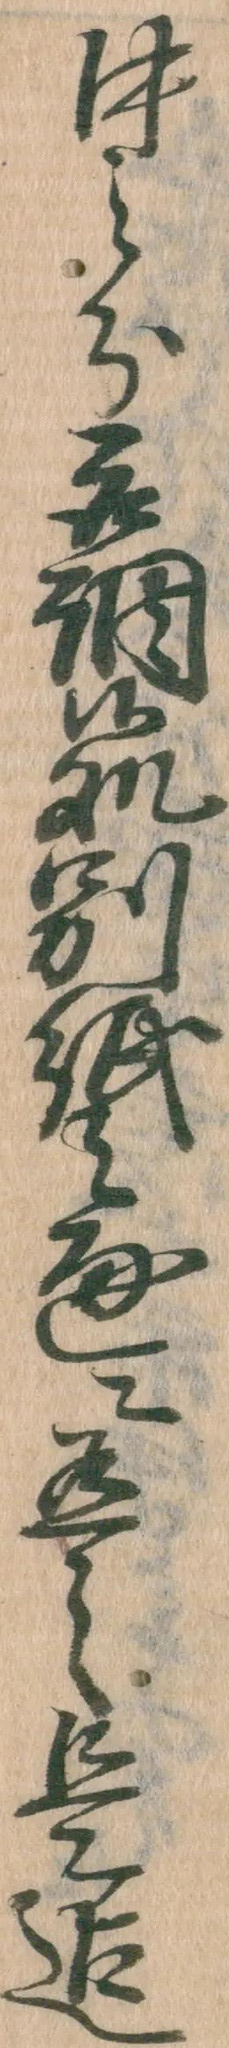中之分取調候処別紙之通ニ有之是迄
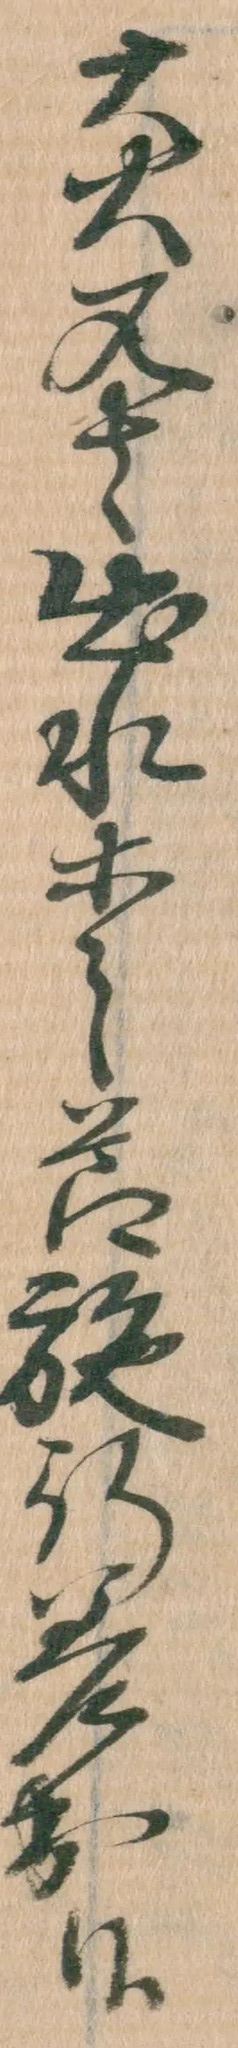大火又は出水等之節施行差出候
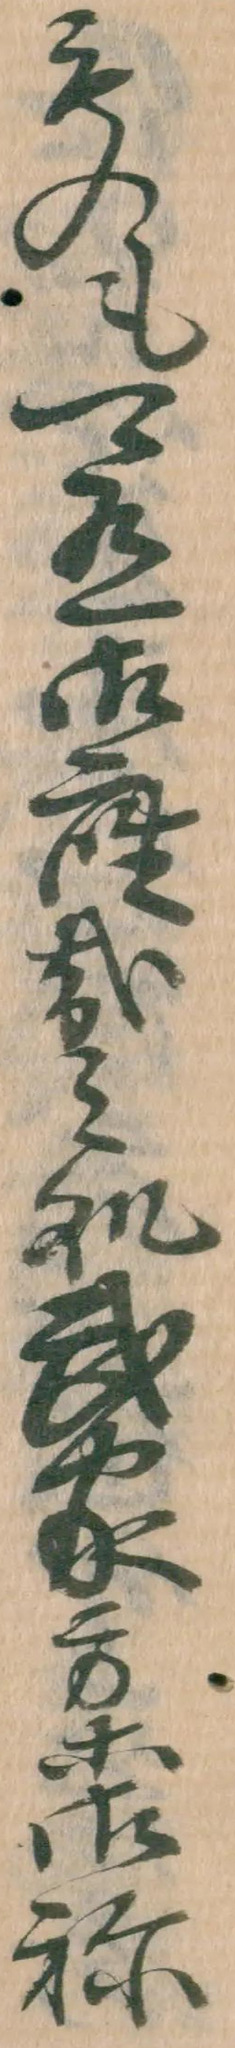ものも可有御座哉之処武家方等御称
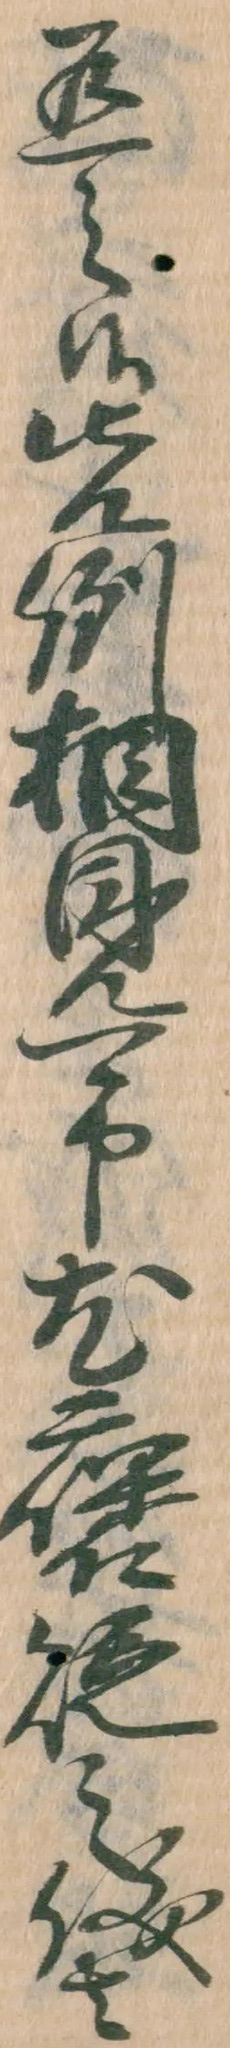有之候先例相見可申尤褒貶之儀は
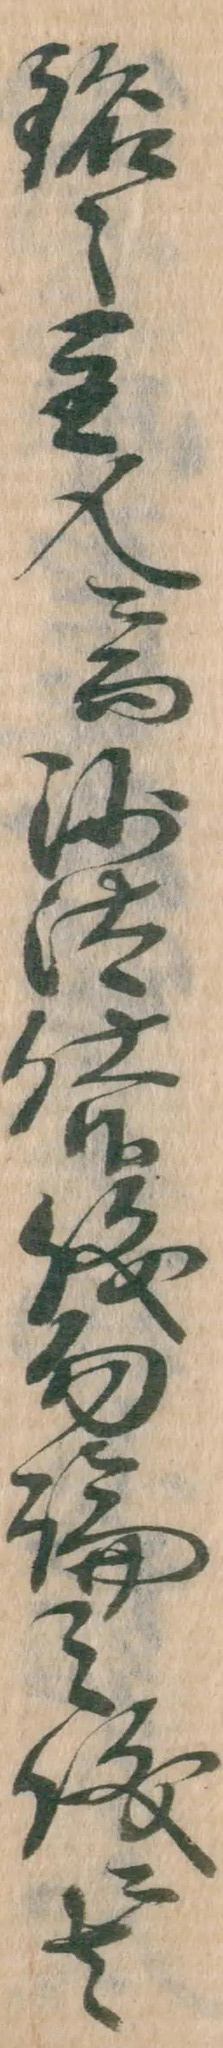銘々主人ニ而沙汰仕候儀勿論之儀ニは
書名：武家方并寺院等ニテ施差出候一件
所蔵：国立国会図書館 National Diet Library, JAPAN
